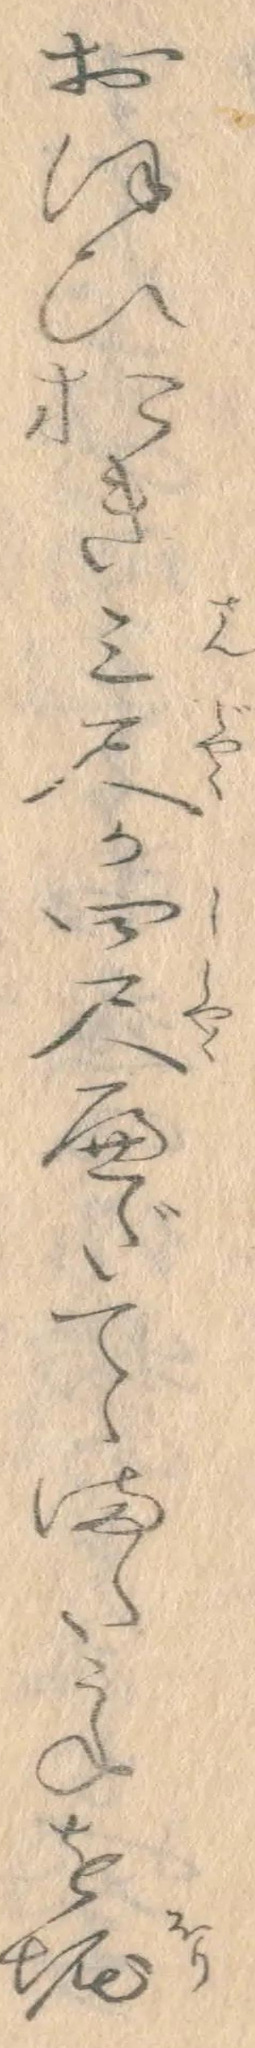おほひおき三尺か四尺へだてゝまたうねを堀
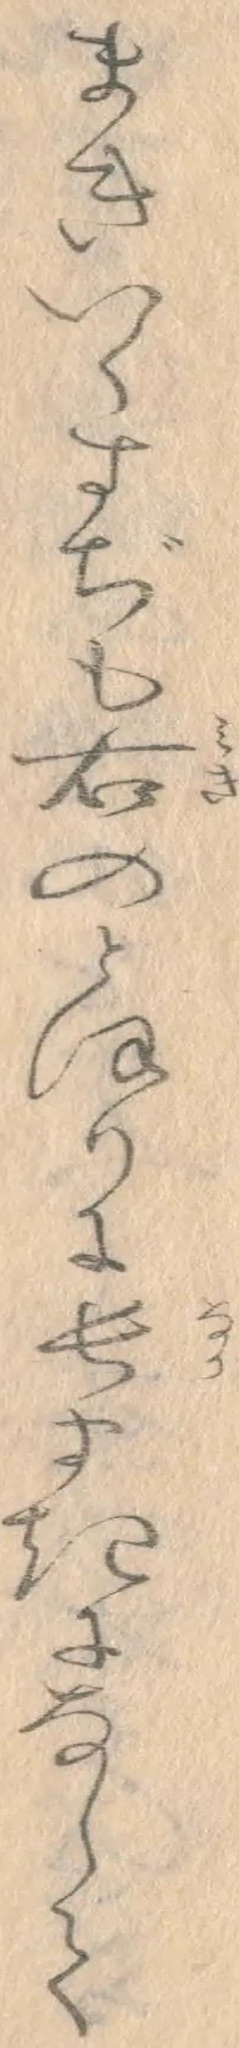まきいくすぢも右のとほりに長まきになして

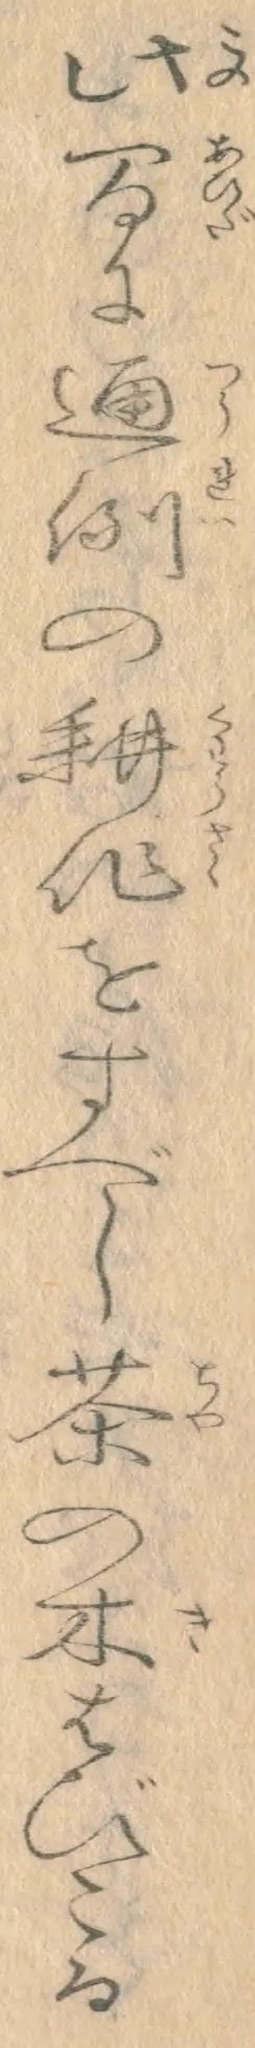此間に通例の耕作をすべし茶の木はびこる
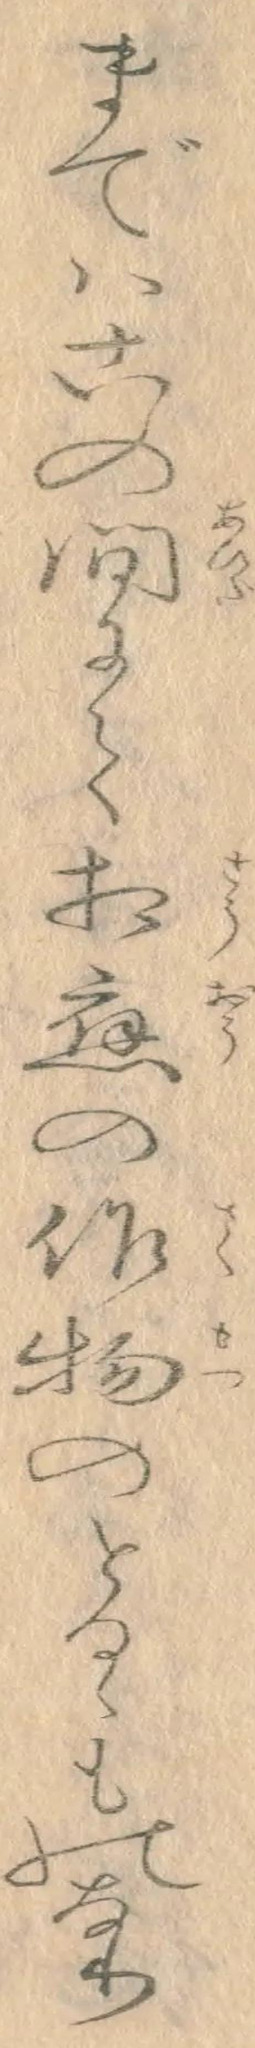まではこの間にて相応の作物のとるゝものなり
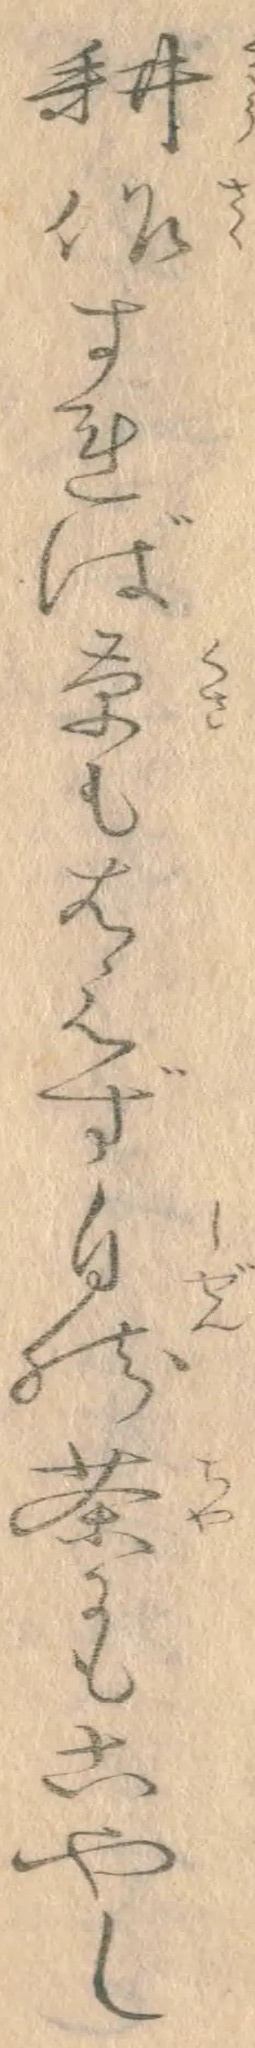耕作すれば草もはえず自然茶にもこやし
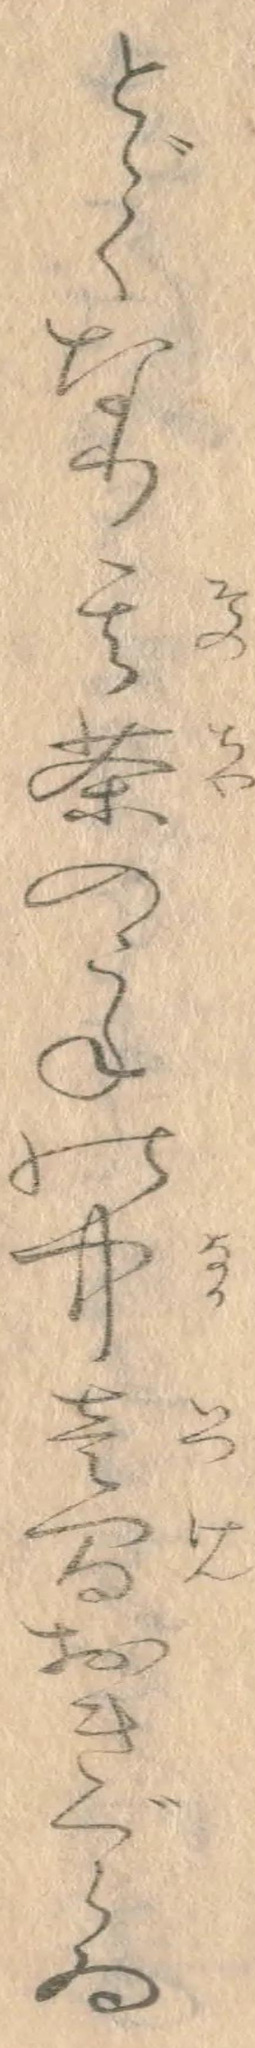とゞくなり其茶のうねの中壱間おきぐらゐ
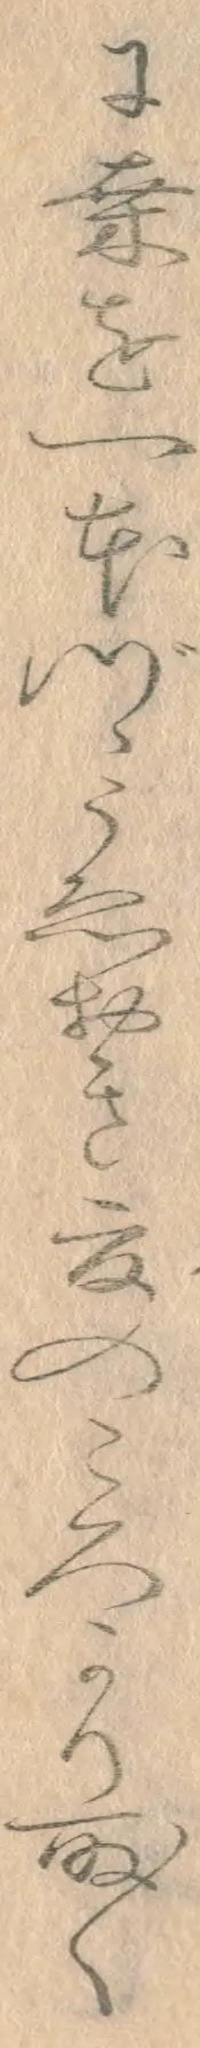に桑を一本づゝうゑおき夏のころより取〳〵
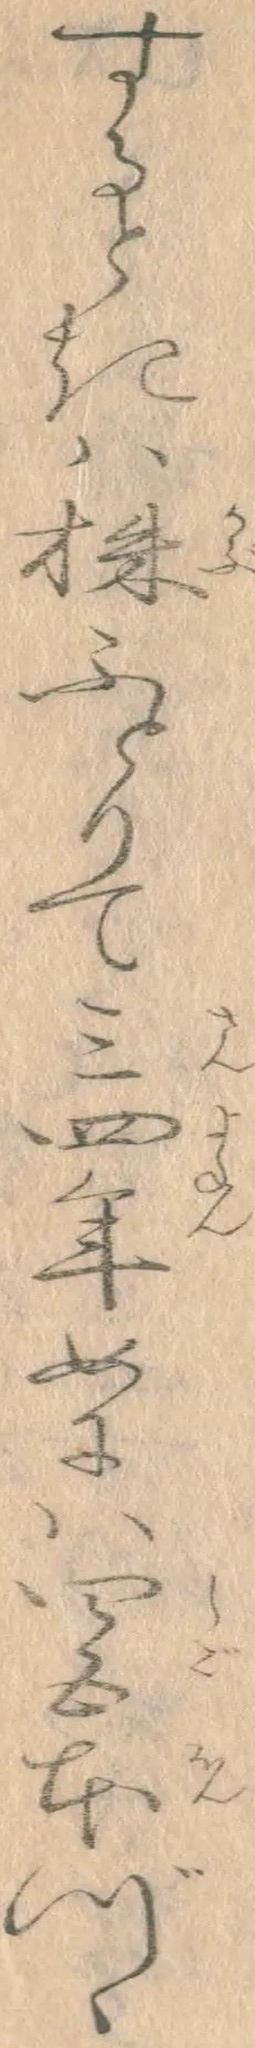するときは株ふとりて三四年めには四五本づゝ
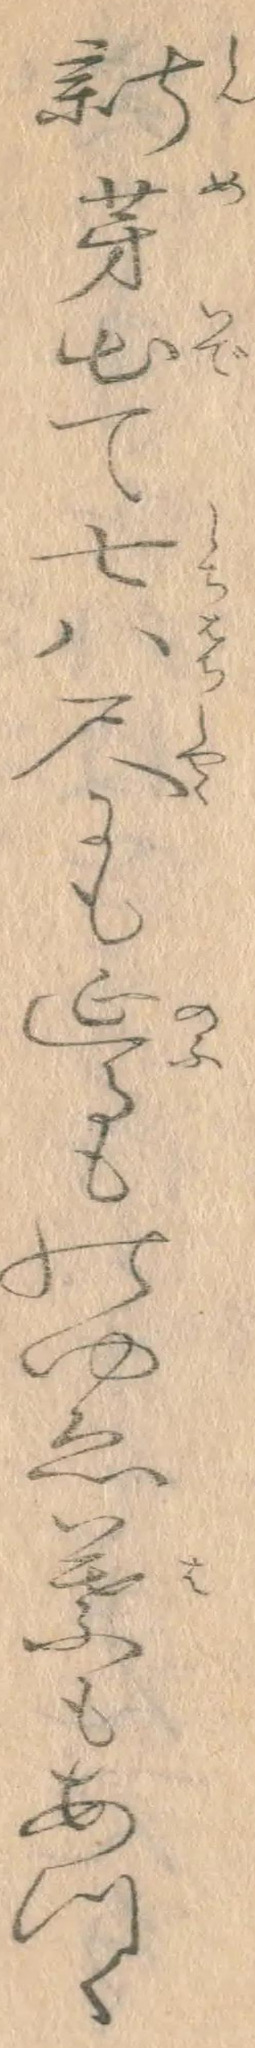新芽出て七八尺にも延るものゆゑ葉もあつく
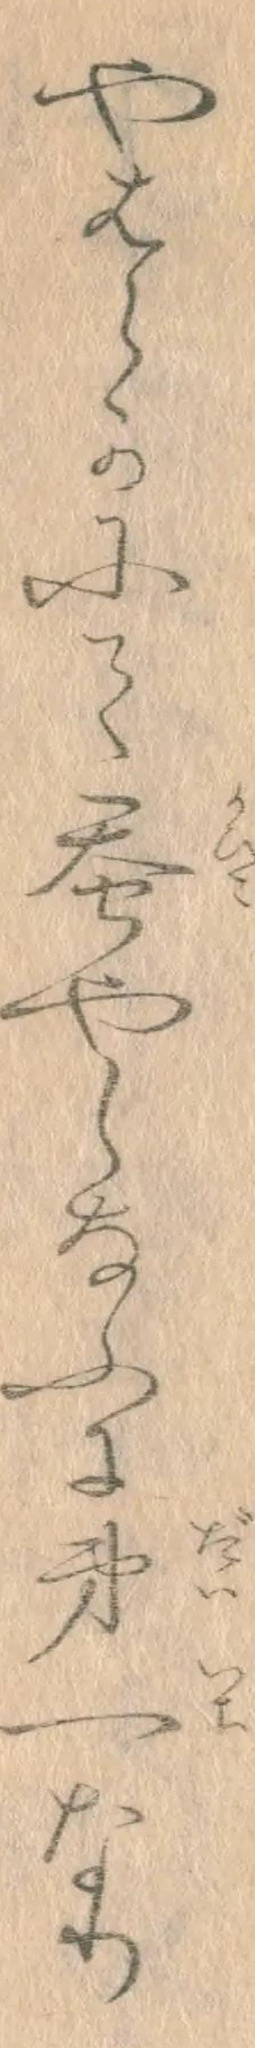やはらかにて蚕やしなふに第一なり
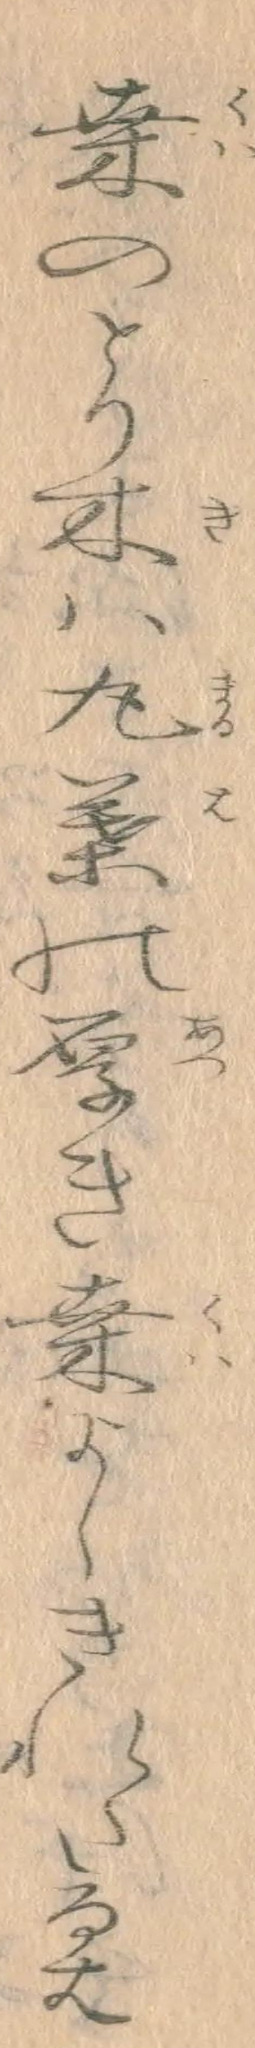一桑のとり木は丸葉の厚き桑よしきれたるは
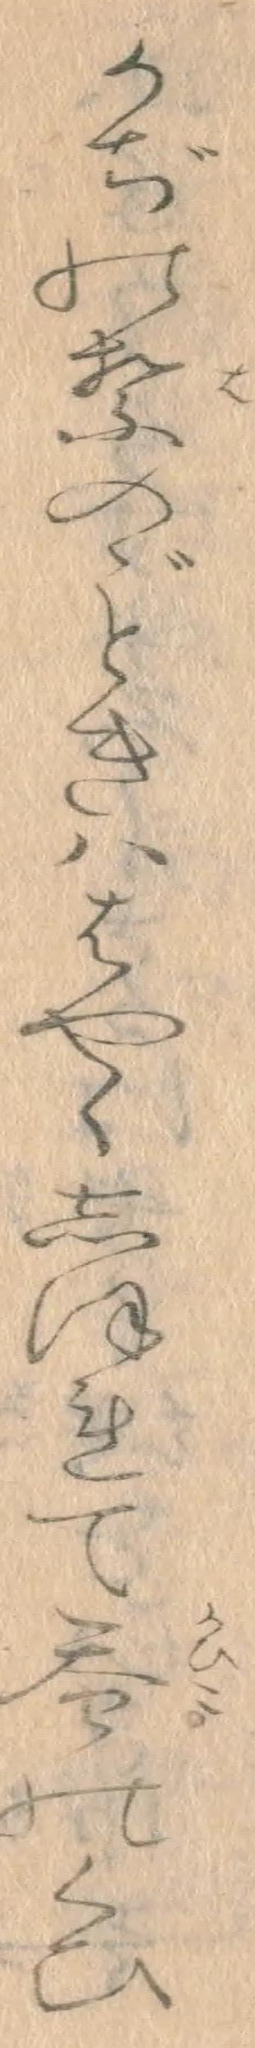かぢの葉のごときははやくしほれて蚕のくい
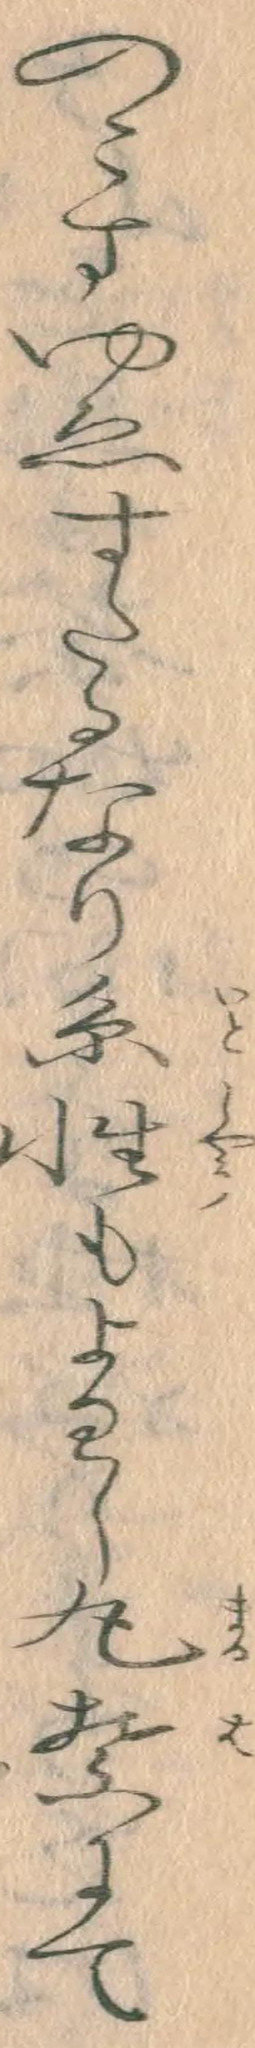のこすゆゑすたるなり。糸性もよわし丸葉にて
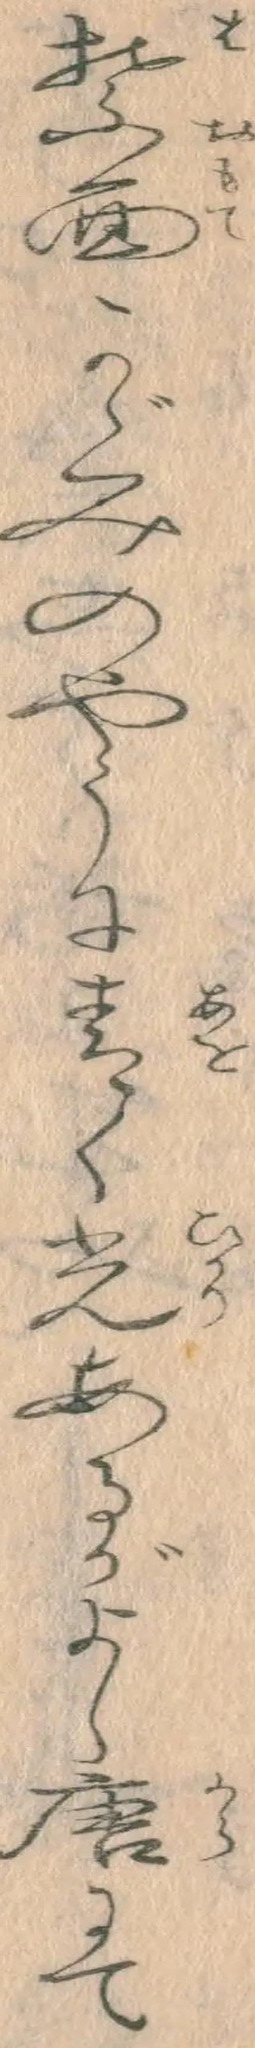葉面かゞみのやうに青く光あるがよし唐にて
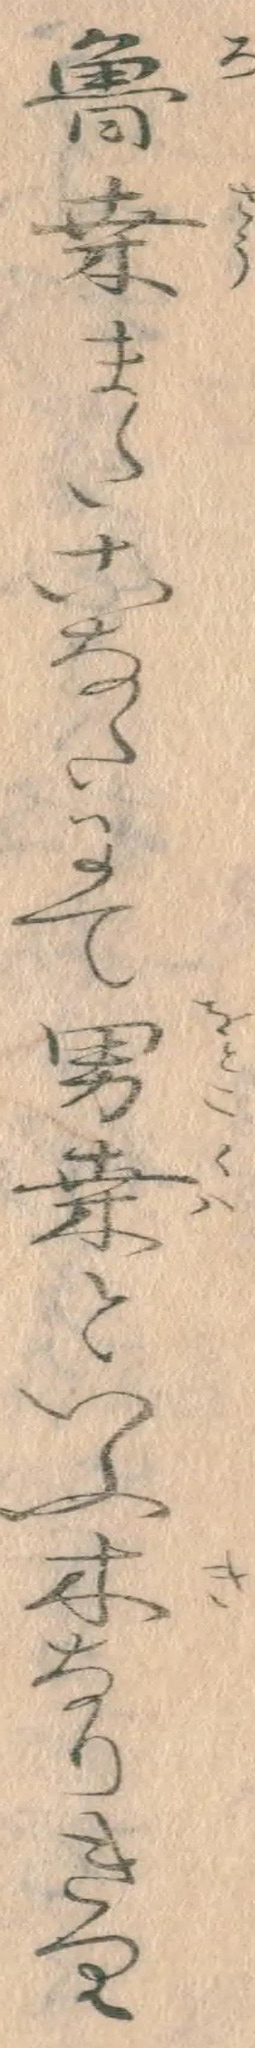魯桑またこなたにて男桑といふ木なりきり
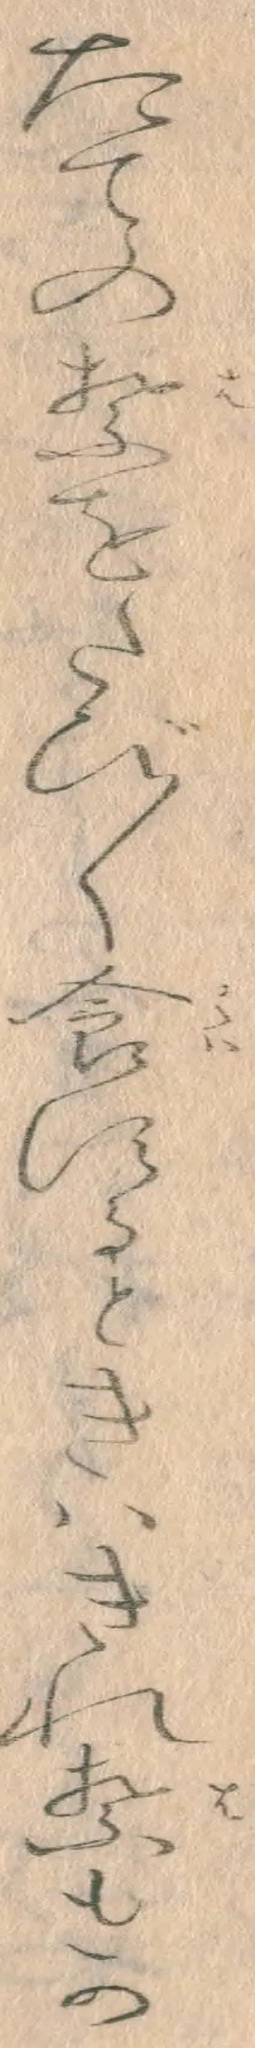たての葉をたび〳〵食するときはきれ葉もか
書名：蚕茶并紙木植方書
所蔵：国立国会図書館 National Diet Library, JAPAN
